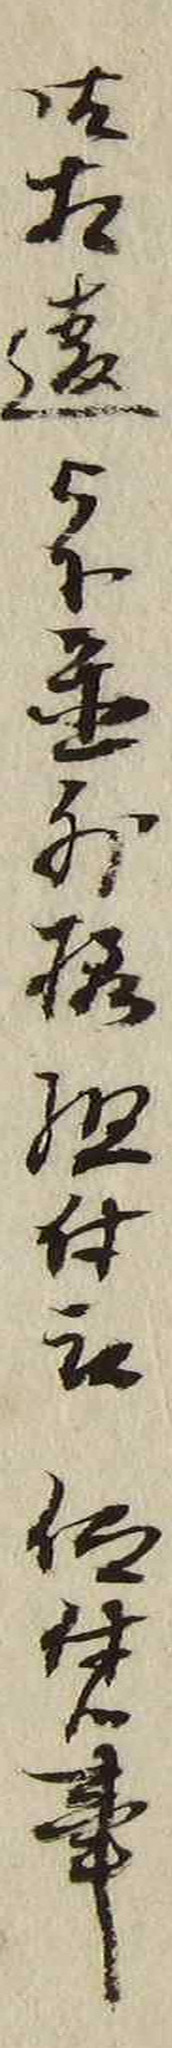御相違被下置外様組付被仰付候事
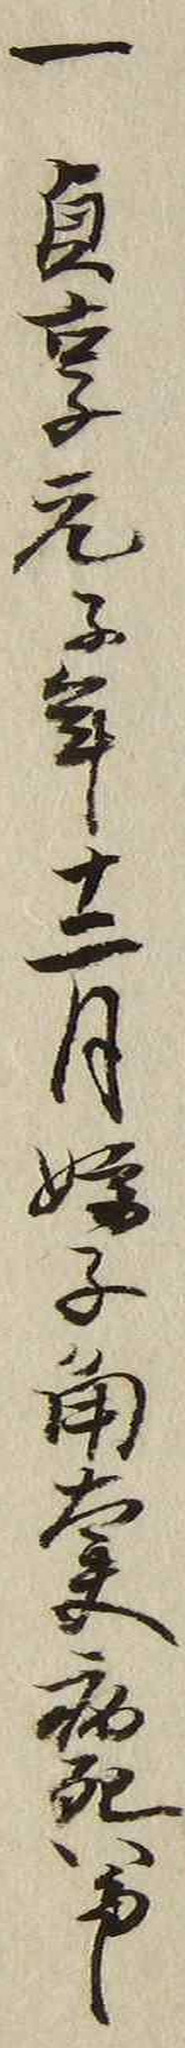一貞享元子年十二月嫡子角太夫病死いたし

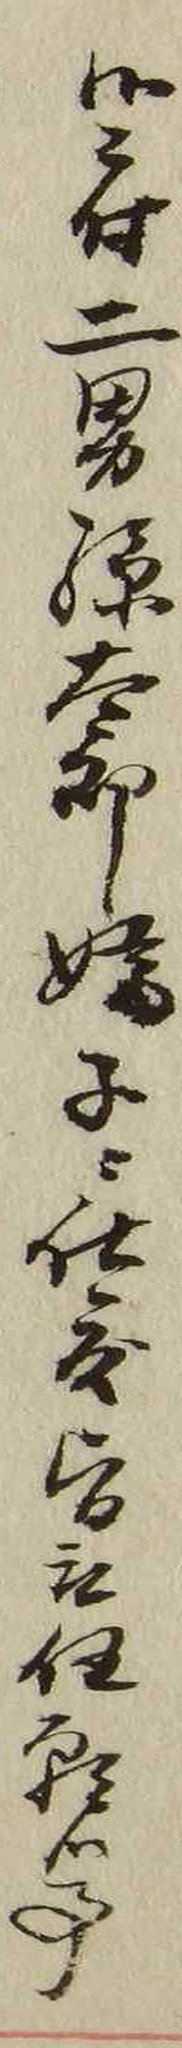候ニ付二男孫太郎嫡子ニ仕度旨被任願候事
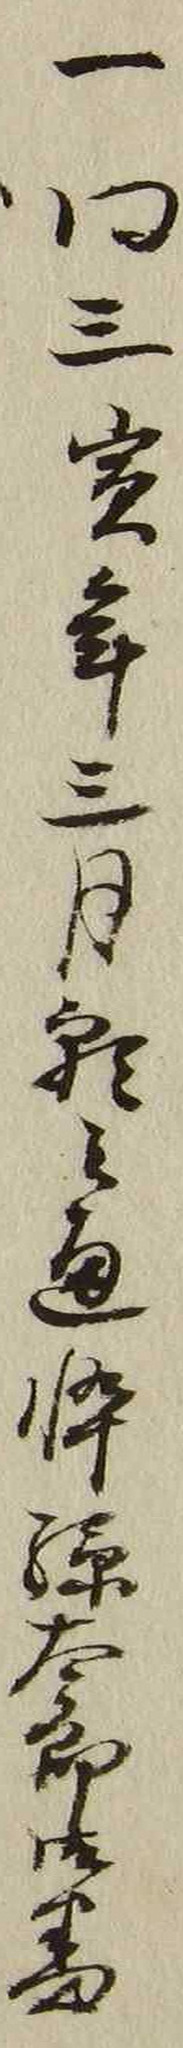一同三寅年三月願之通忰孫太郎御番
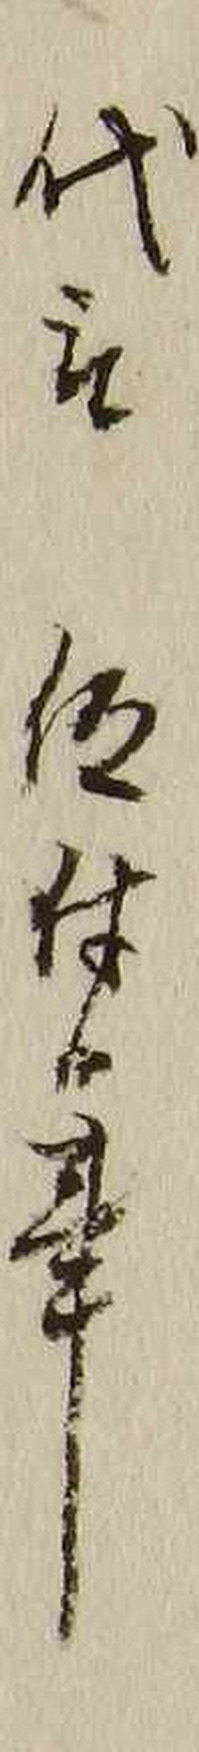代被仰付候事
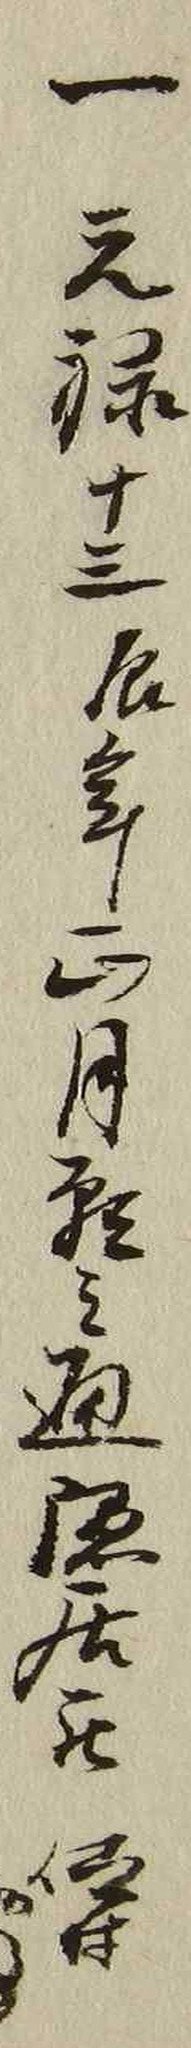一元録十三辰年正月願之通隠居被仰付候事
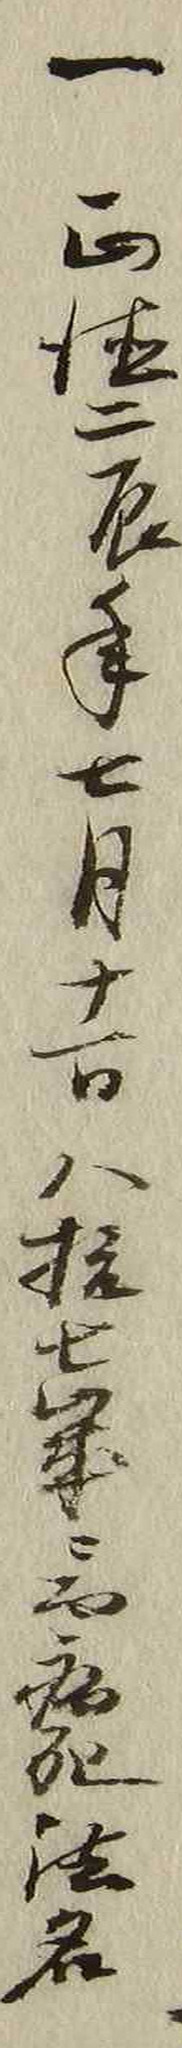一正徳二辰年七月十一日八拾七歳ニ而病死法名
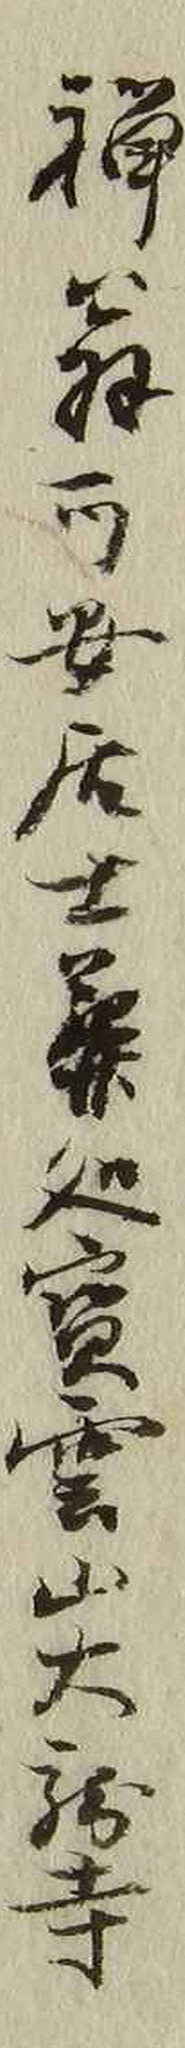禅翁可安居士葬処宝雲山大龍寺
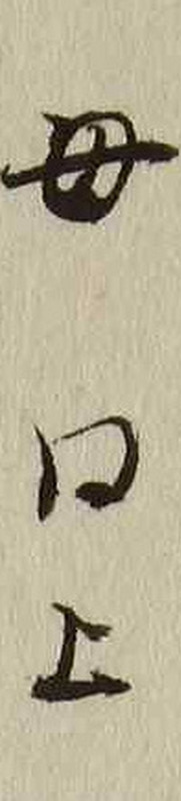母同上
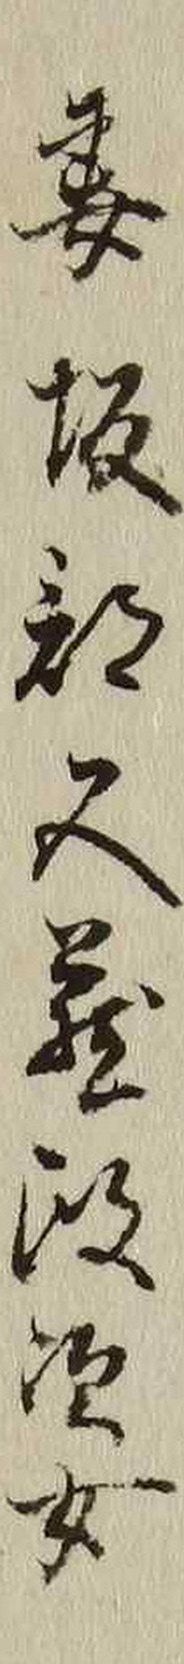妻坂部又蔵政次女
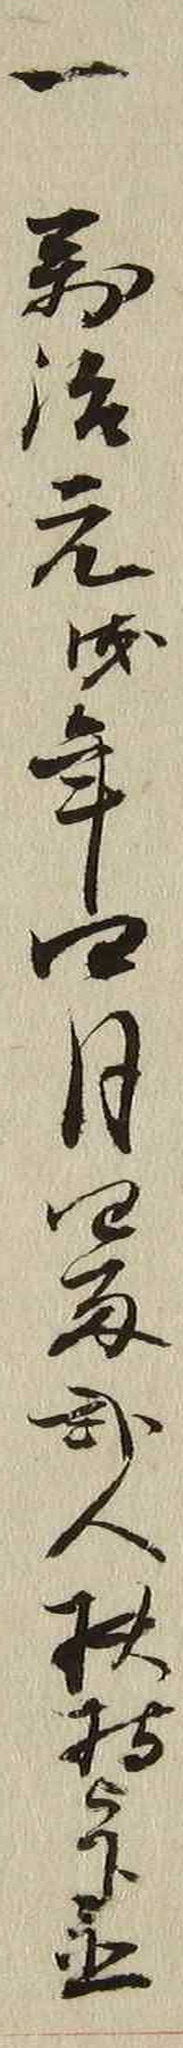一万治元戌年四月四両弐人扶持被下置
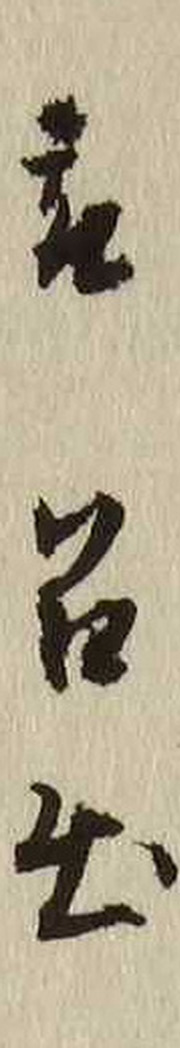被召出
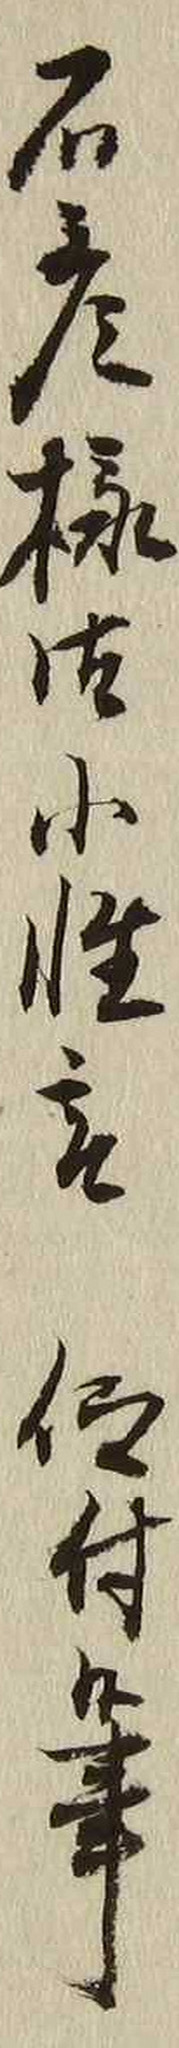石彦様御小性被仰付候事
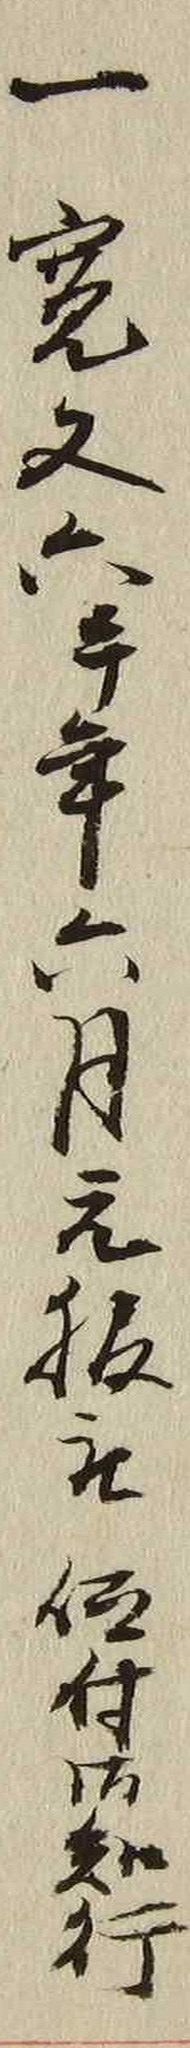一寛又六午年六月元服被仰付御知行
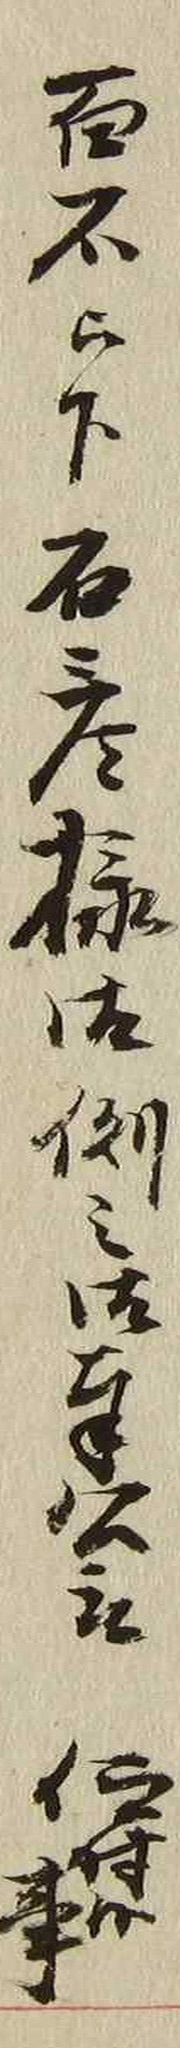百石被下石彦様御側之御奉公被仰付候事
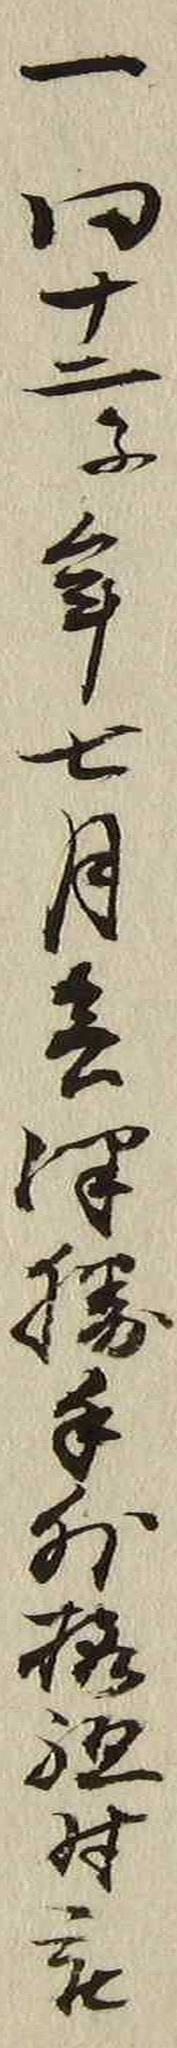一同十二子年七月会津勝手外様組付被
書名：諸士系譜　巻之349　も之部5
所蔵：会津若松市立会津図書館
